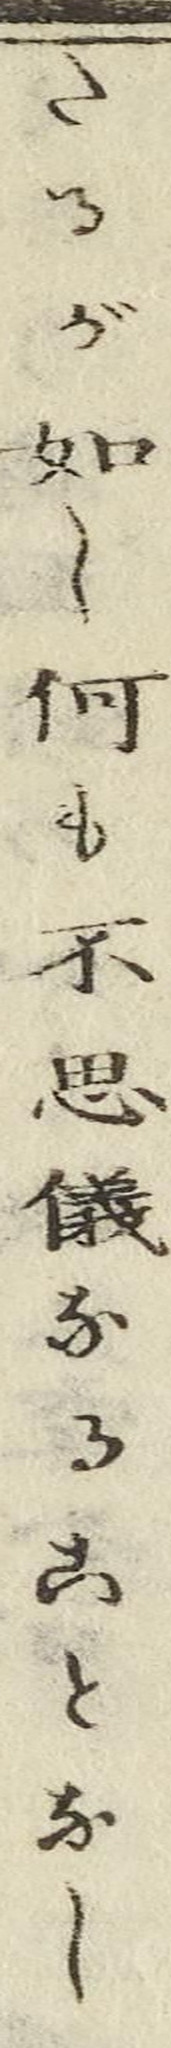たるが如し何も不思議なることなし
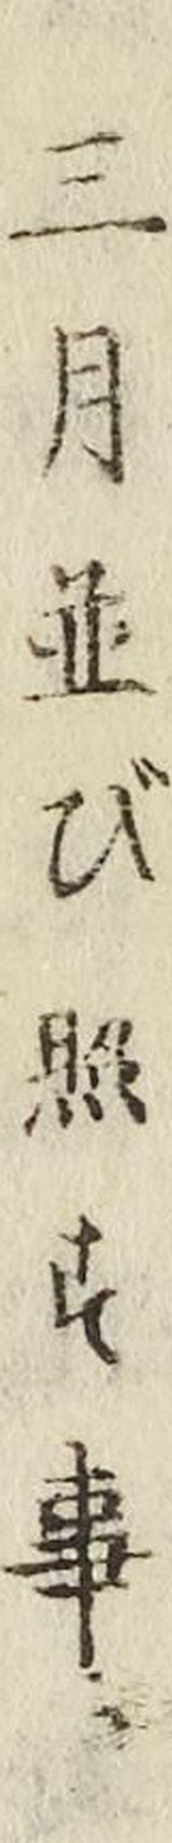三月並び照す事
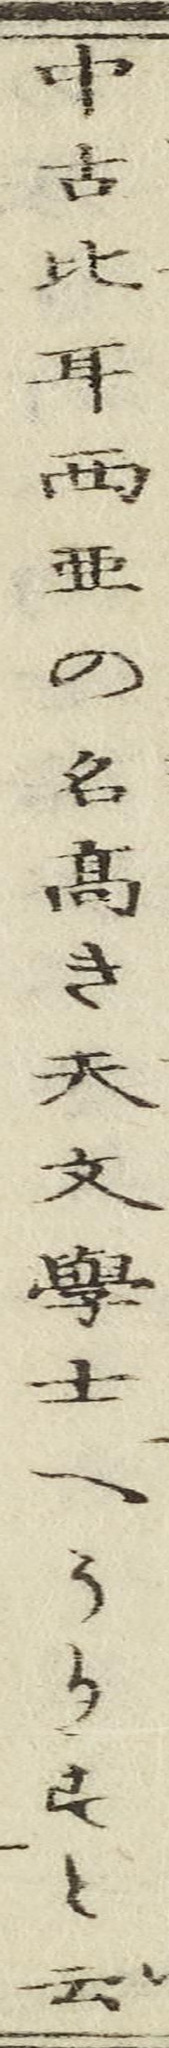中古比耳西亜の名高き天文学士「へうりす」と云
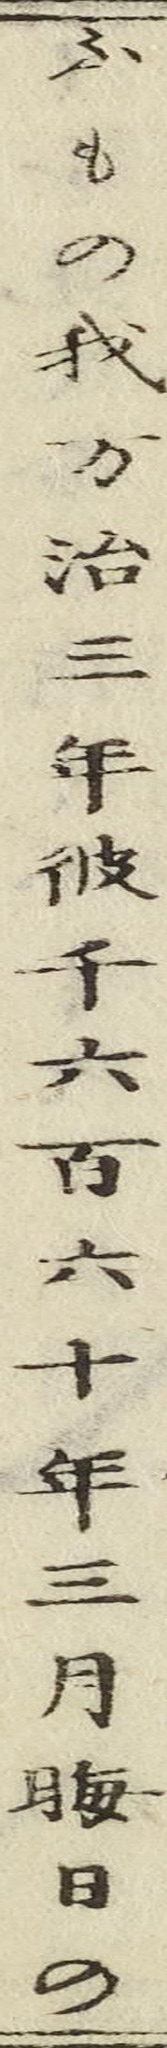ふもの我万治三年彼千六百六十年三月晦日の
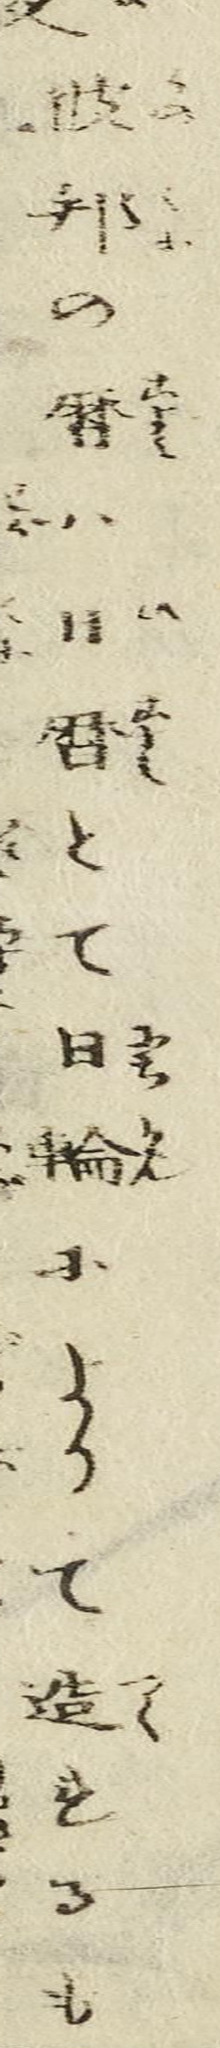夜彼邦の暦は日暦とて日輪によりて造れるも
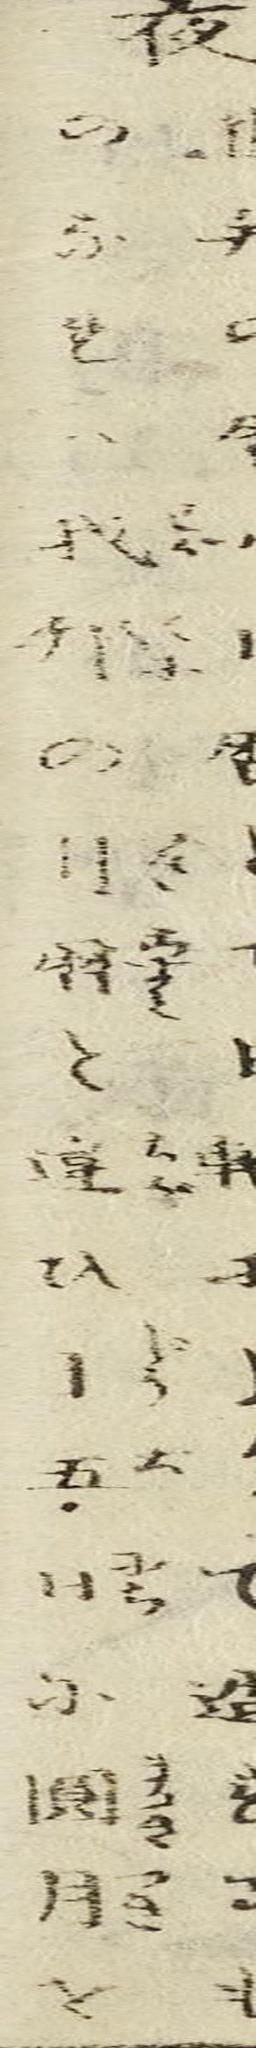のなれは我邦の月暦と違ひ十五日に円月を
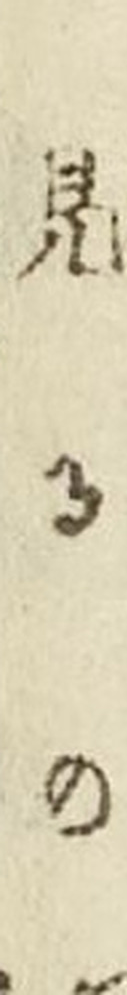見るの
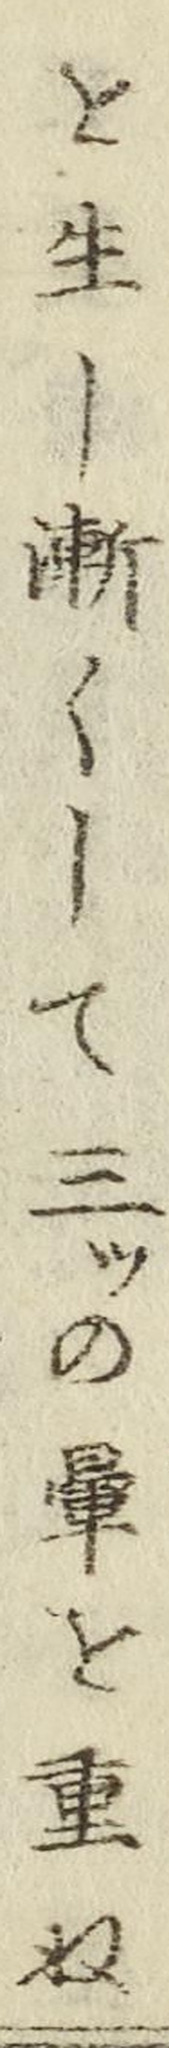を生し漸くして三つの暈を重ね
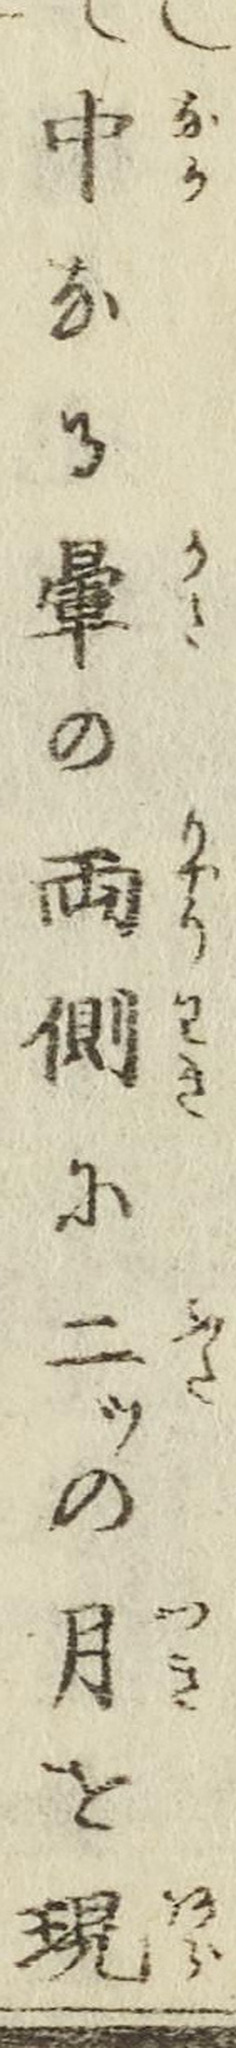中なる暈の両側に二つの月を現
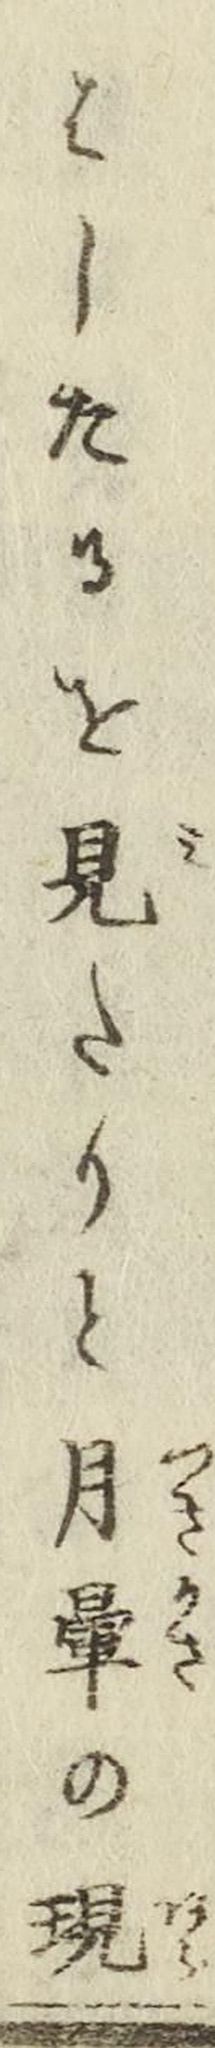はしたるを見たりと月暈の現
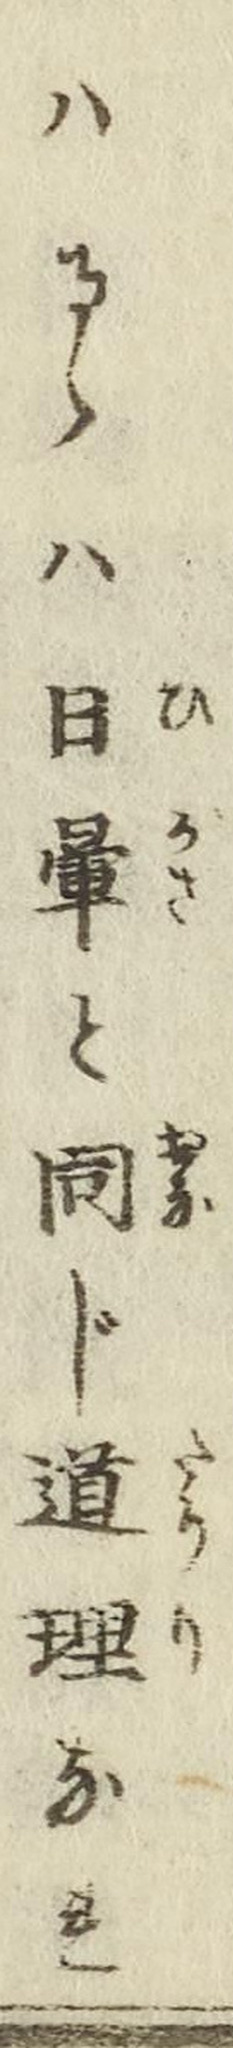はるゝは日暈と同じ道理なれ
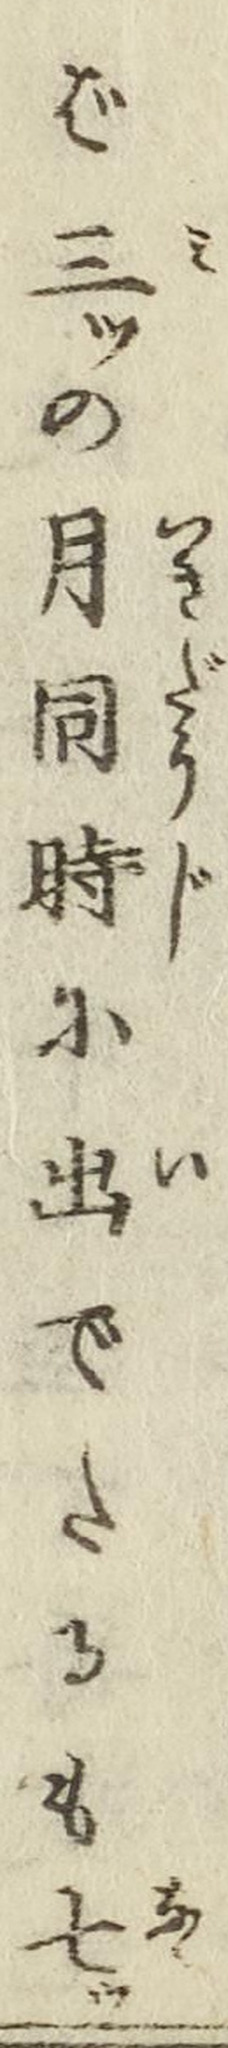ば三つの月同時に出でたるも七つ
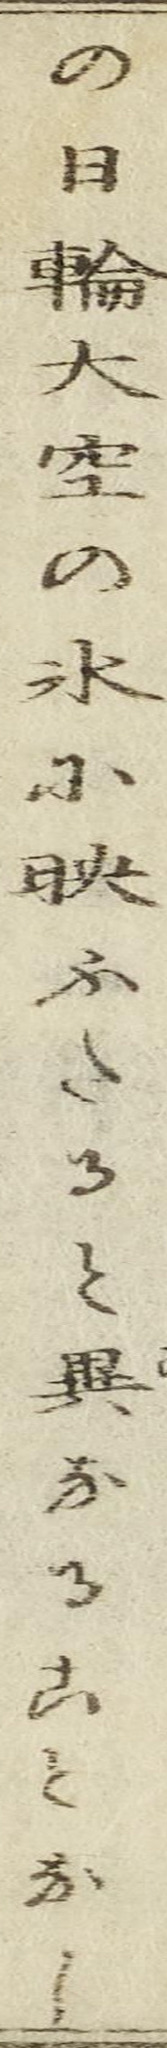の日輪大空の氷に映ふたると異なることなし
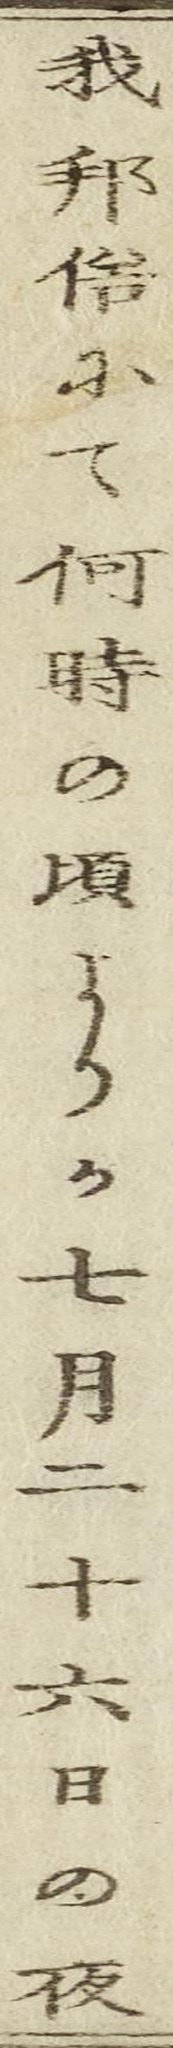我邦俗にて何時の頃よりか七月二十六日の夜
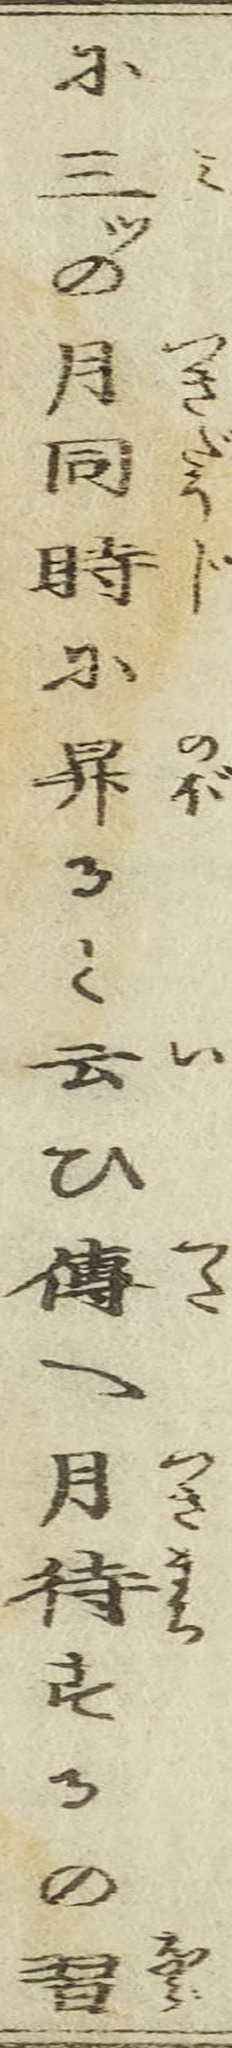に三つの月同時に昇ると云ひ伝へ月待するの習

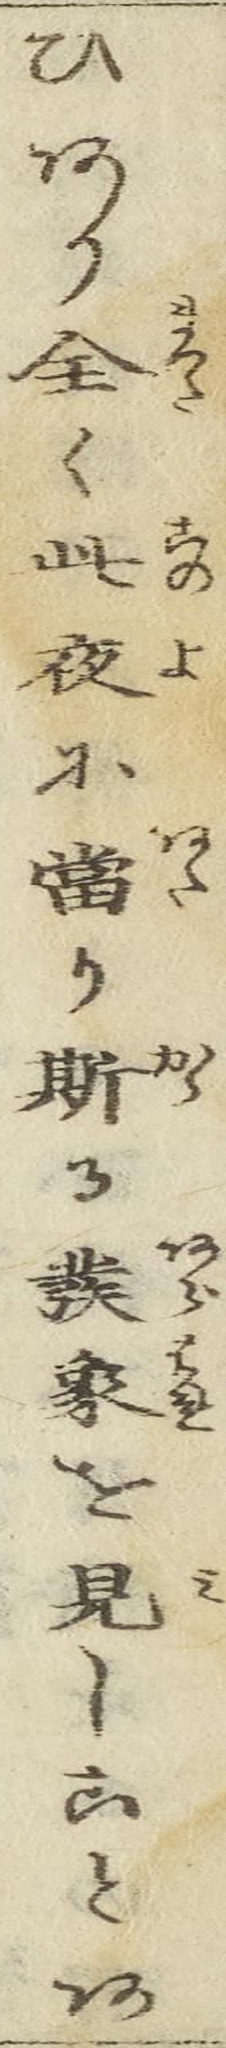ひあり全く此夜に当り斯る発象を見しことあ
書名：天変地異
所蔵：東京大学地震研究所図書室 Earthquake Research Institute Library, The University of Tokyo, JAPAN
